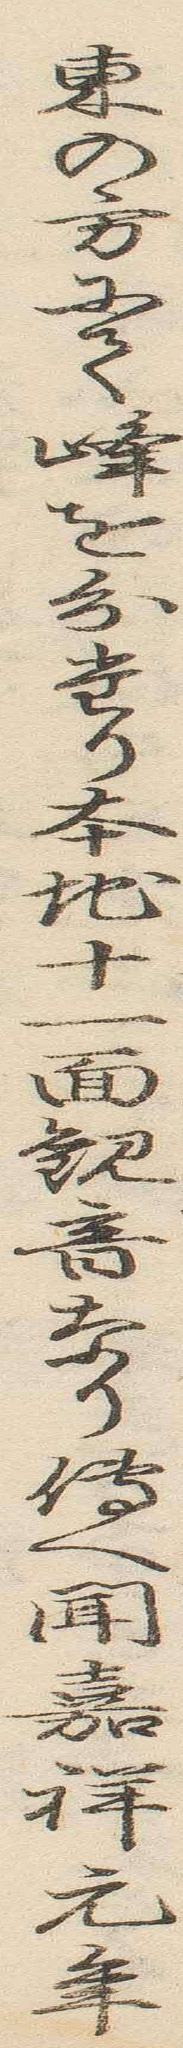東の方にて峰を分たり本地十一面觀音なり傳へ聞嘉祥元年
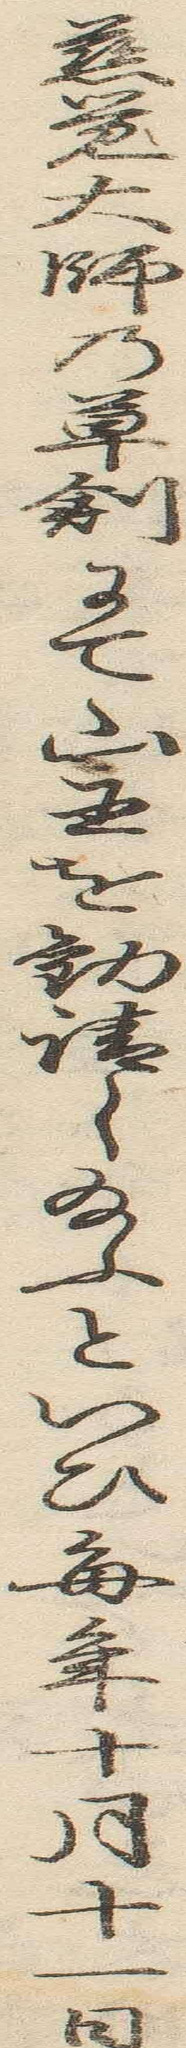慈覚大師の草創にて山王を勸請し給ふといひ每年十月十一日
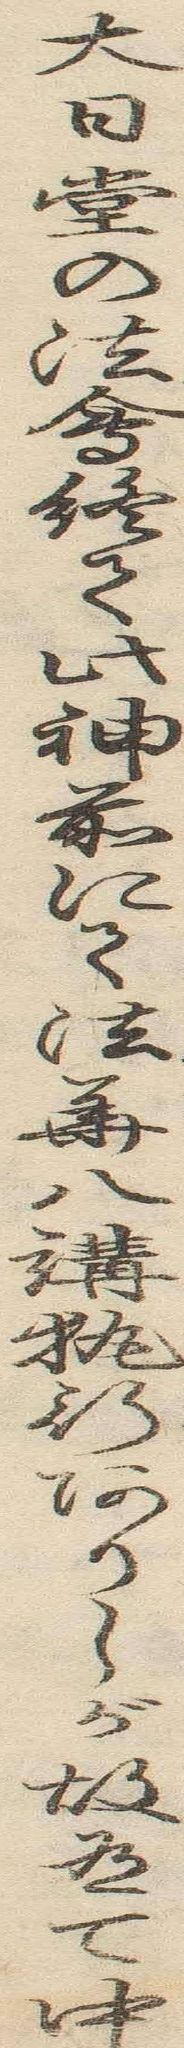大日堂の法會終て此神前にて法華八講執行ありしが故有て中
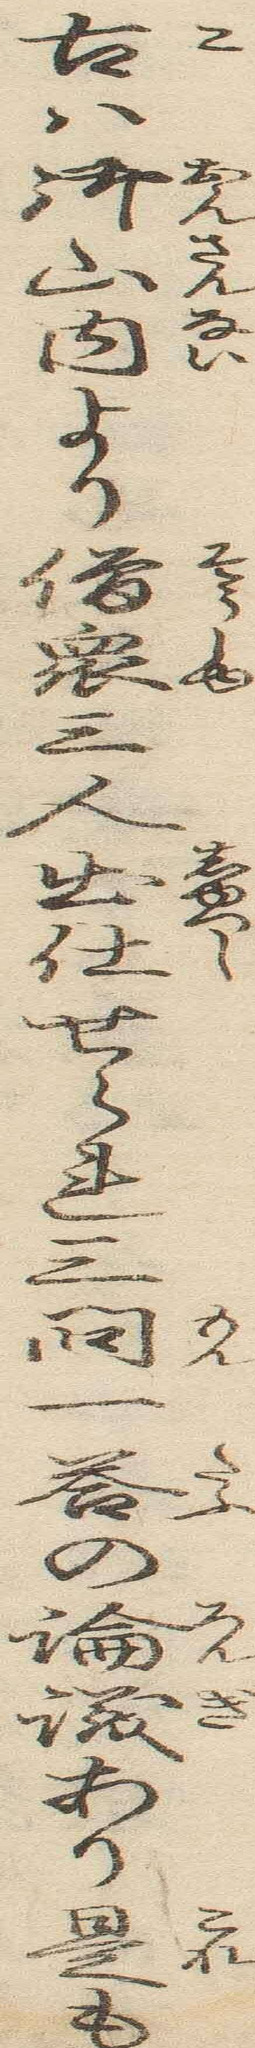古は御山内より僧衆三人出仕せられ三問一荅の論議あり是も
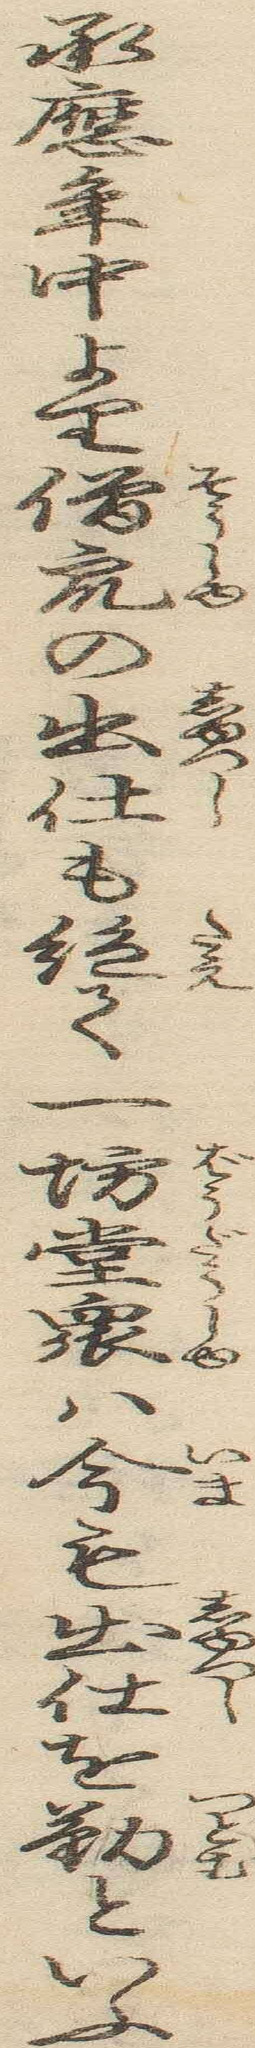承應年中より僧衆の出仕も絶て一坊堂衆は今も出仕を勤といふ

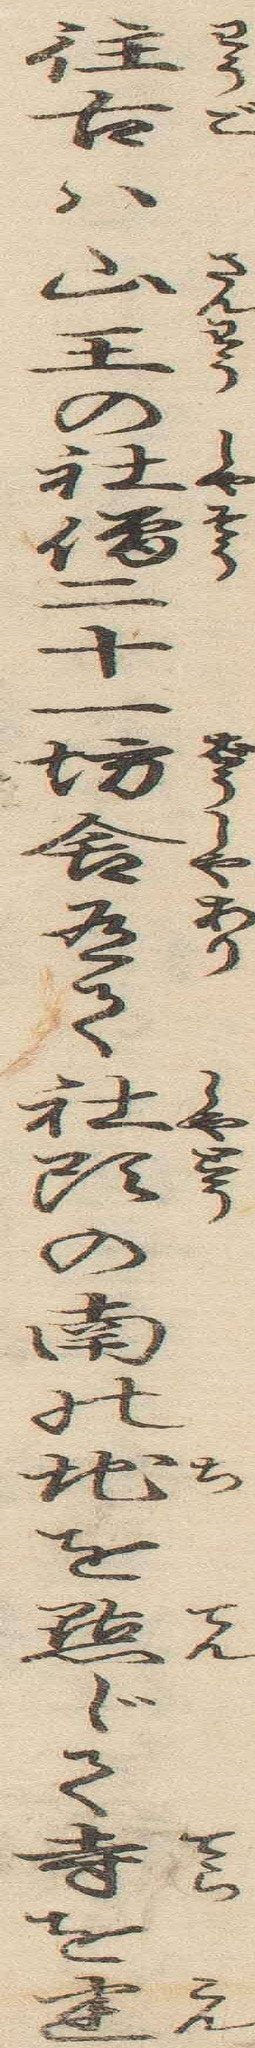往古は山王の社僧二十一坊舍有て社頭の南の地を㸃じて寺を建
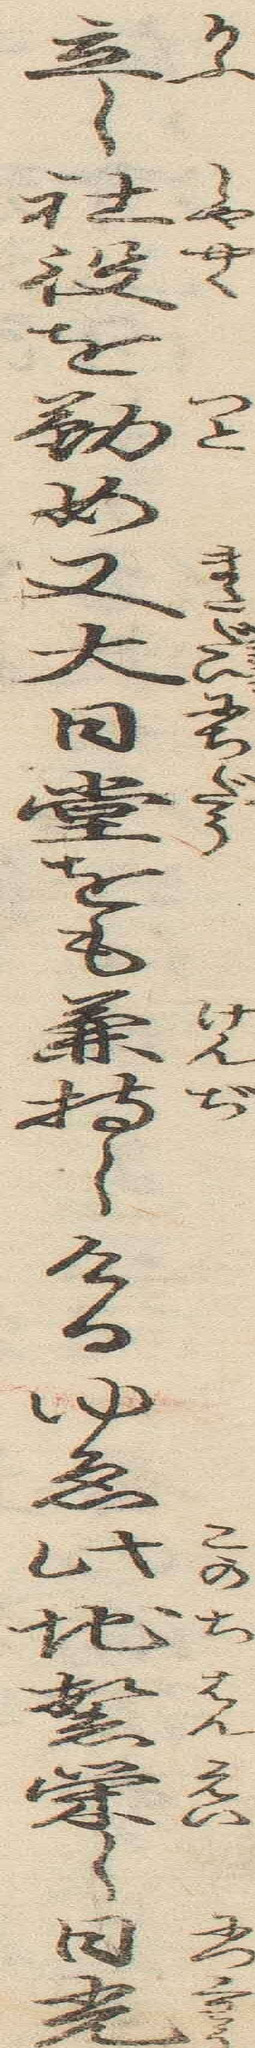立し社役を勤め又大日堂をも兼持しけるゆゑ此地繁栄し日光
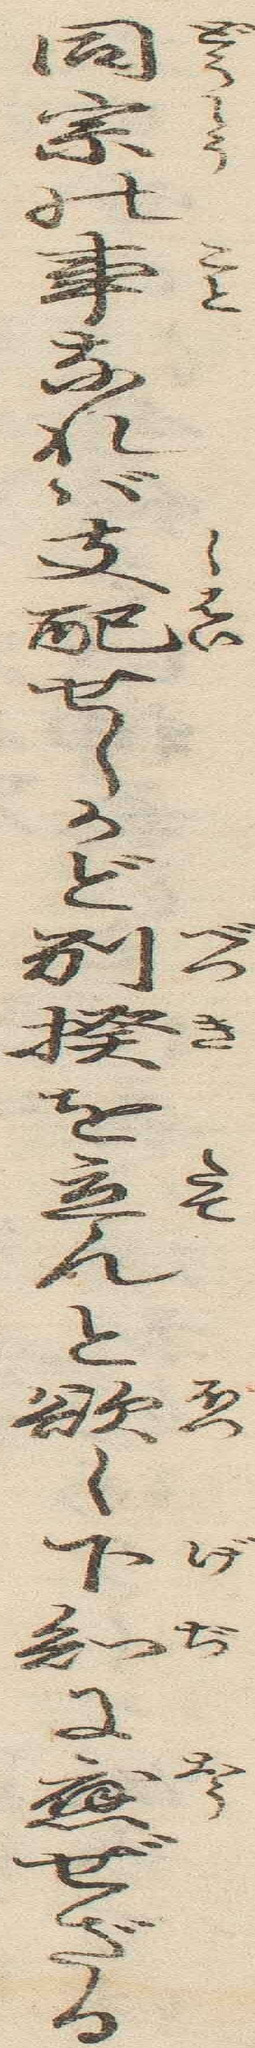同宗の事なれば支配せしかど別揆を立んと欲し下知に應ぜざる
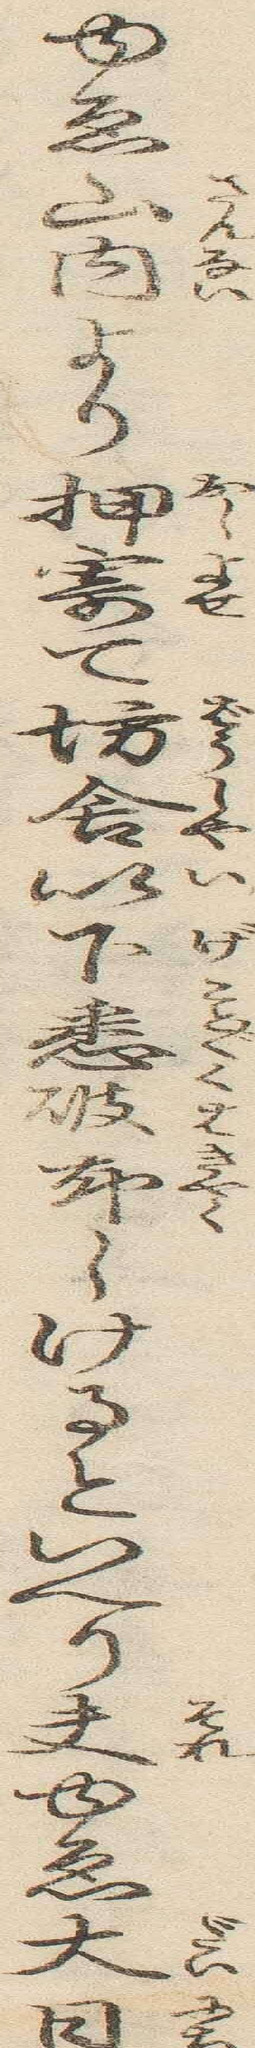ゆゑ山内より押寄て坊舍以下悉破却しけるといへり夫ゆゑ大日
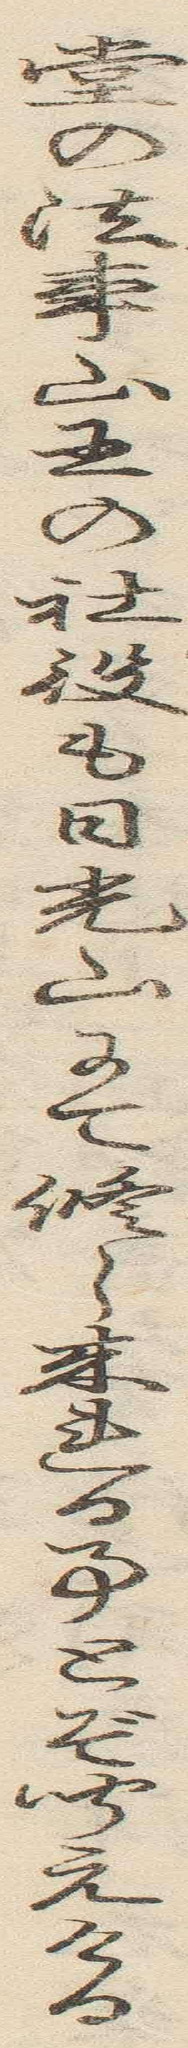堂の法事山王の社役も日光山にて修し來れる事とぞ聞えける
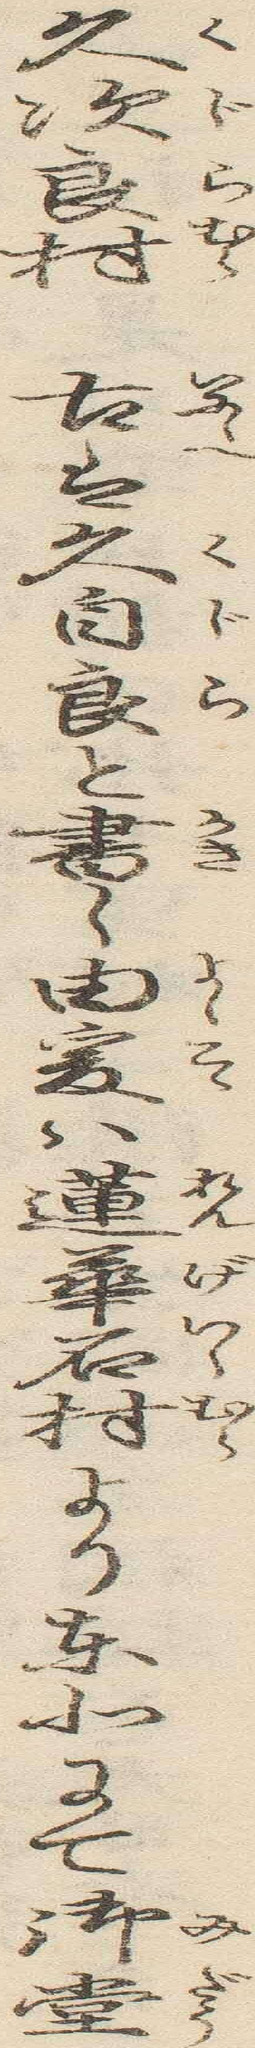久次良村古は久自良と書し由爰は蓮蕐石村より東北にて御堂
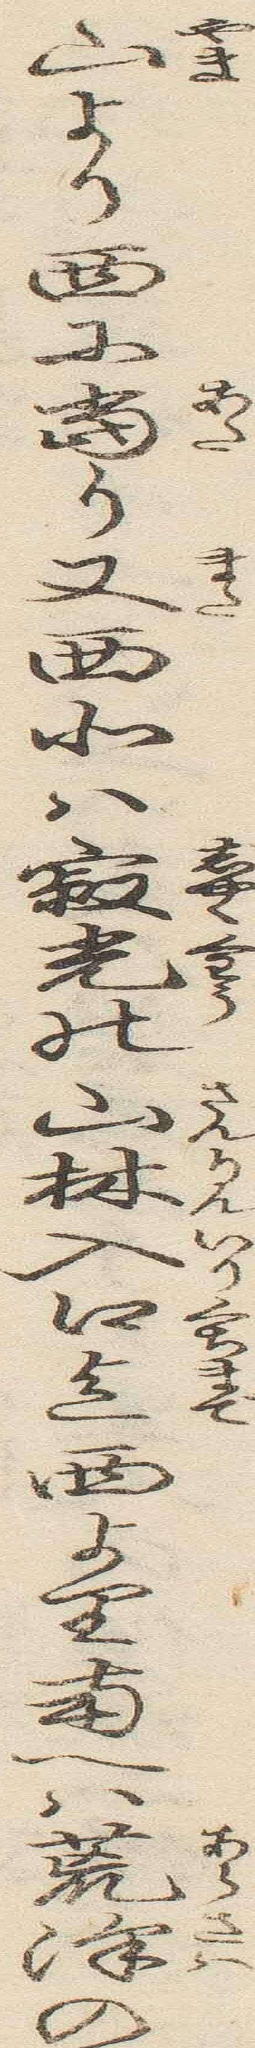山より西に當り又西北は寂光の山林入口迄西より南へは荒澤の
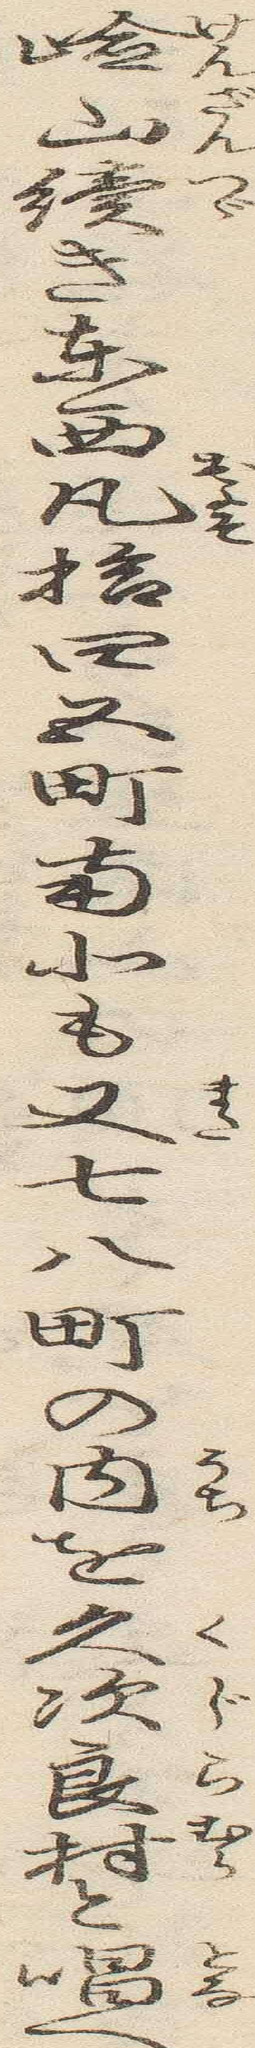嶮山續き東西凡拾四五町南北も又七八町の内を久次良村と唱へ
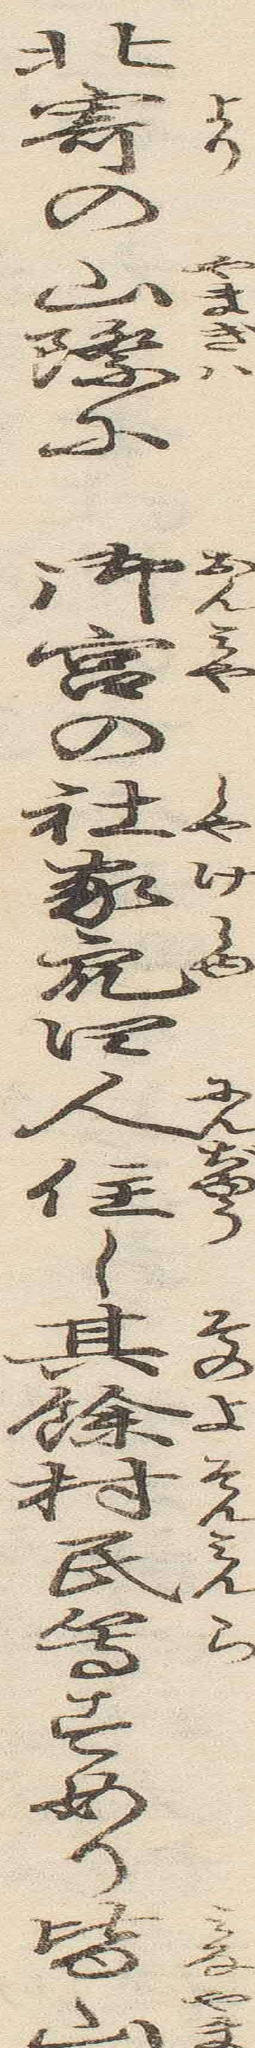北寄の山際に御宮の社家衆四人住し其餘村民等すめり皆山
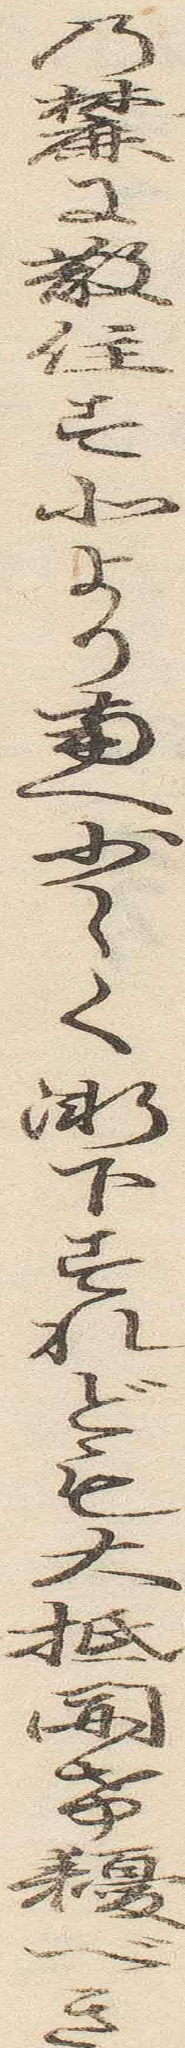の麓に散住す北より南へ少しく漸下すれども大抵開け耰べき
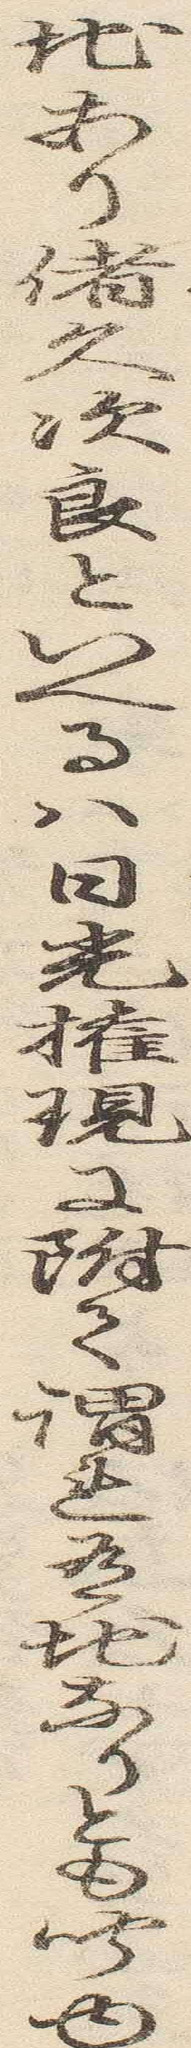地あり偖久次良といへるは日光権現に附て謂れ有地なりとも聞ゆ
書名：日光山志
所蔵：東京学芸大学附属図書館 国文学研究資料館
